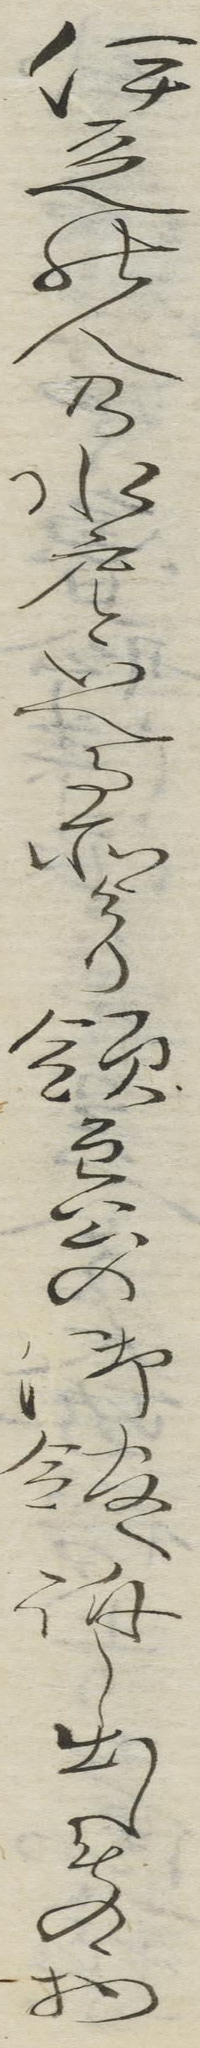伊豆の人の水戸といへる所より領主公の御館へ訴し出候ものゝ物
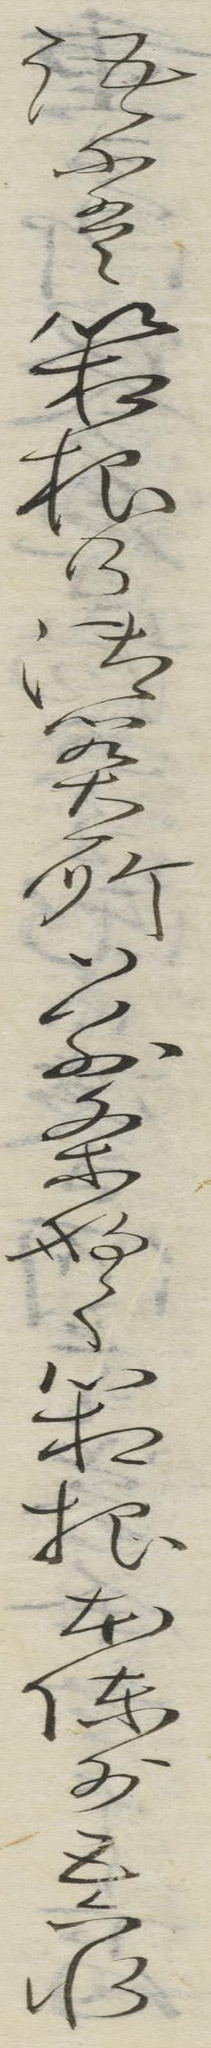語に有之箱根の御関所ハ別条なく箱根本陣分五六軒
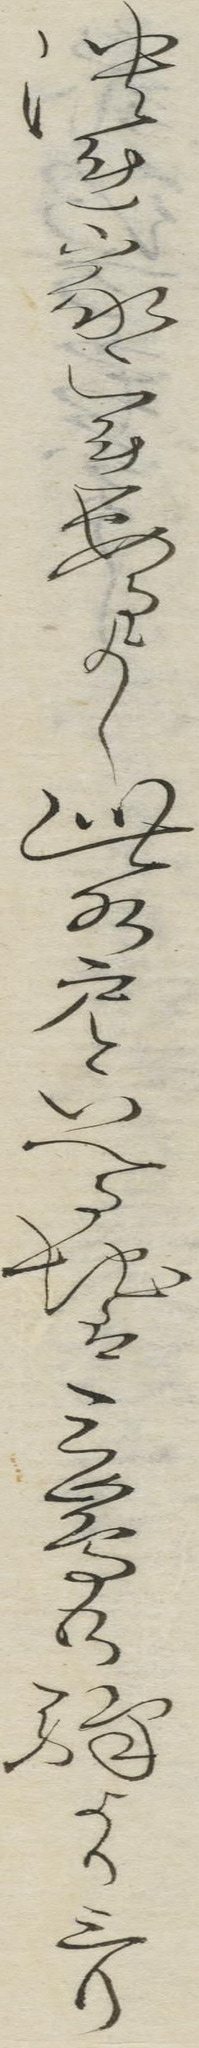潰れ家これあるよし此水戸といへる地は三嶌の駅より三り
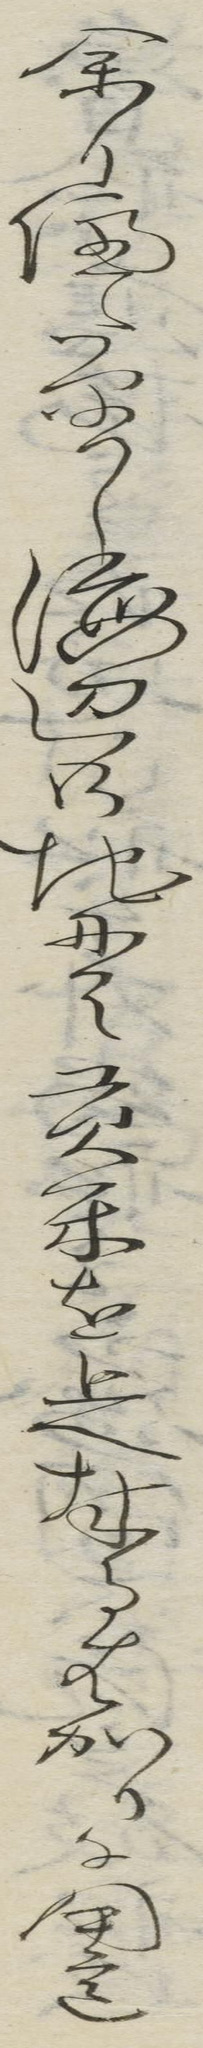余り偏たりし海辺の地にて貢米を上へ奉るはかりに用意
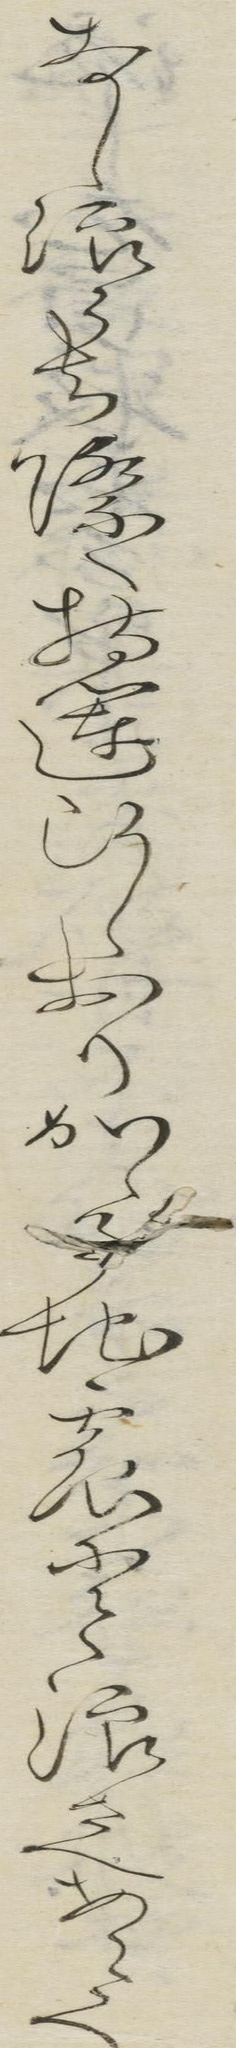なし浪うち際へ持運行くおりかゝる地震にて浪さへあらく
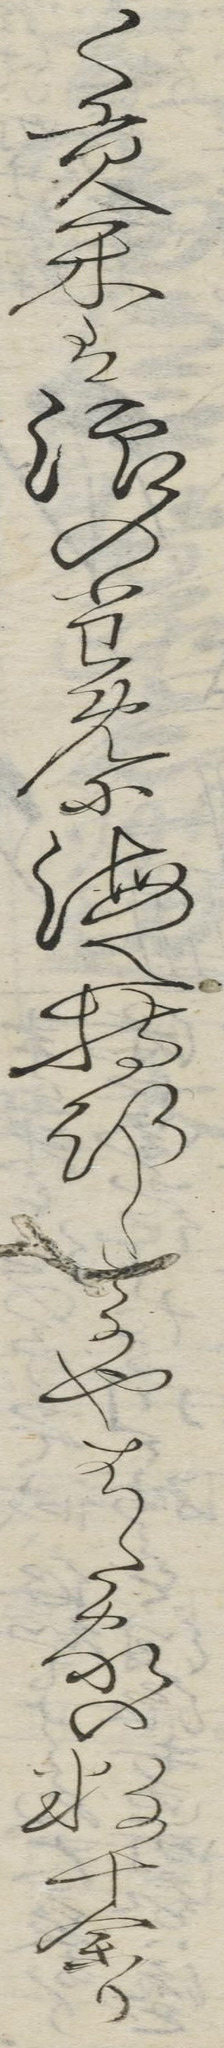く貢米は浪のために海へ持得たかるやはた家の数十余り
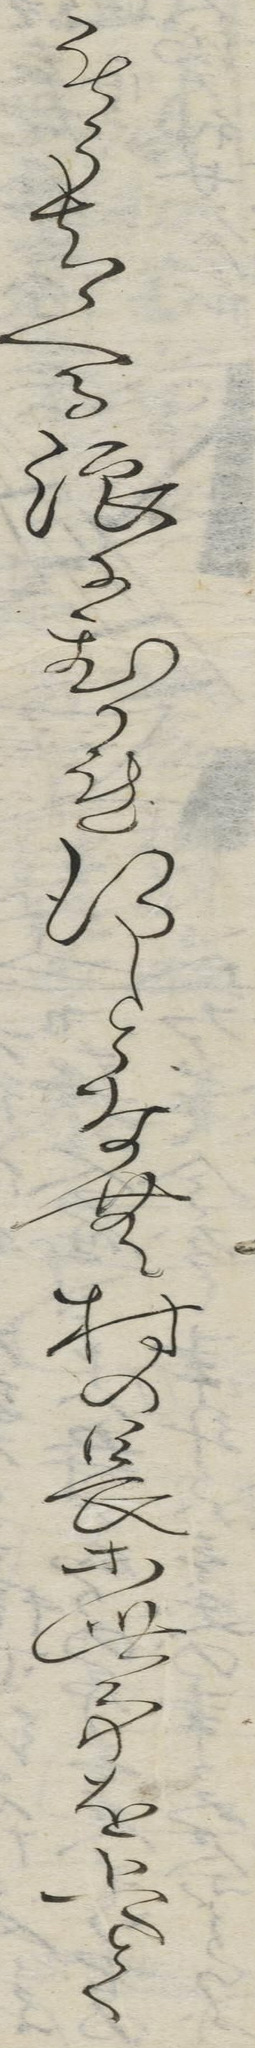其うち人馬浪にむかれ得しとなむ村の長等此事を上へとく
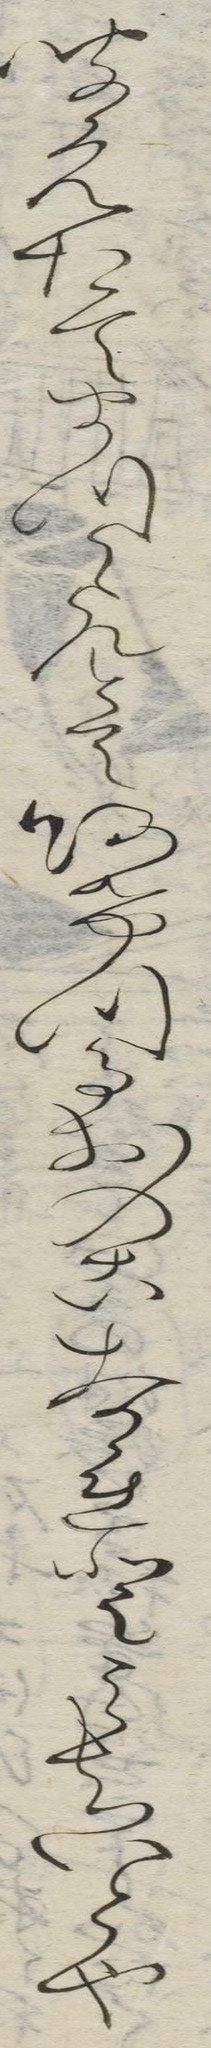聞めたてまつらんとてあけつるおのこなれとミちいとや
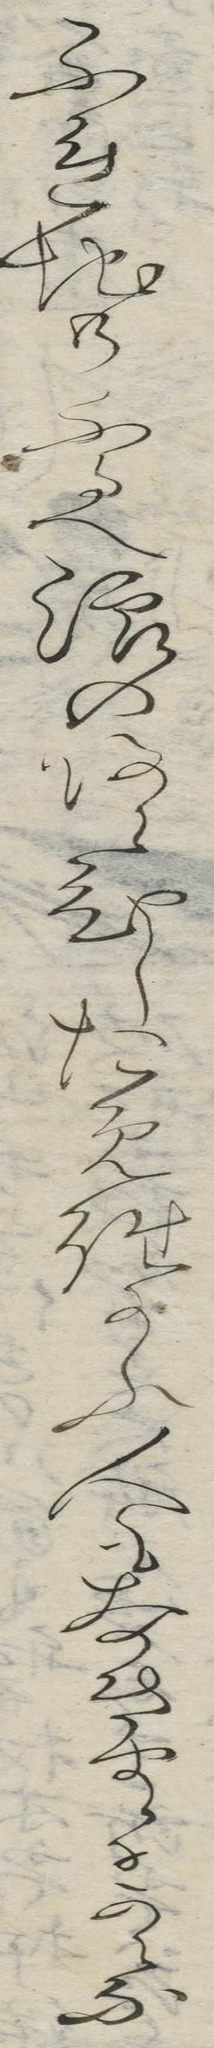ふれ地のふるへ浪のあらきしため往かふ人もなき由候にからふ
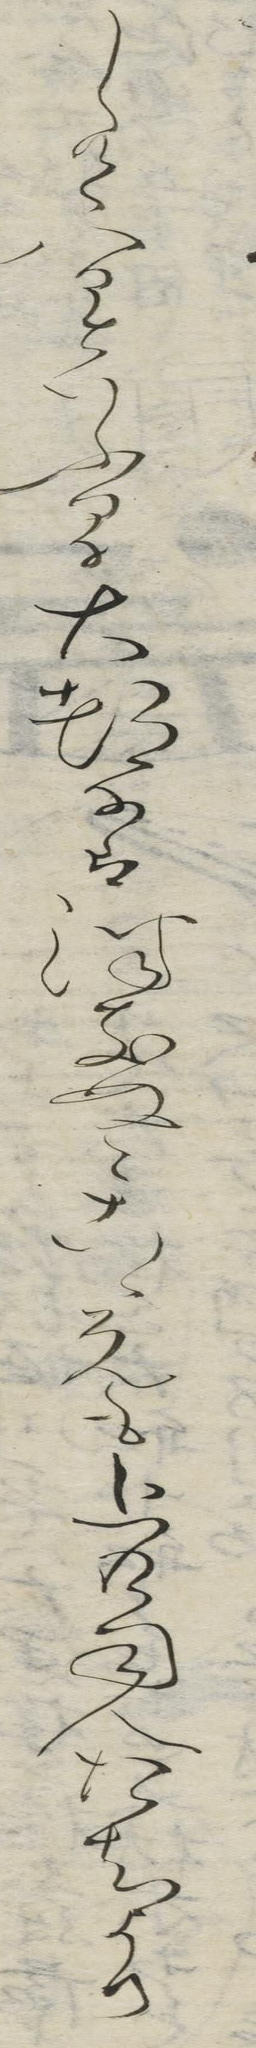し候八里いふかに大都にはつなぬとこゝろんも上の用人たちより
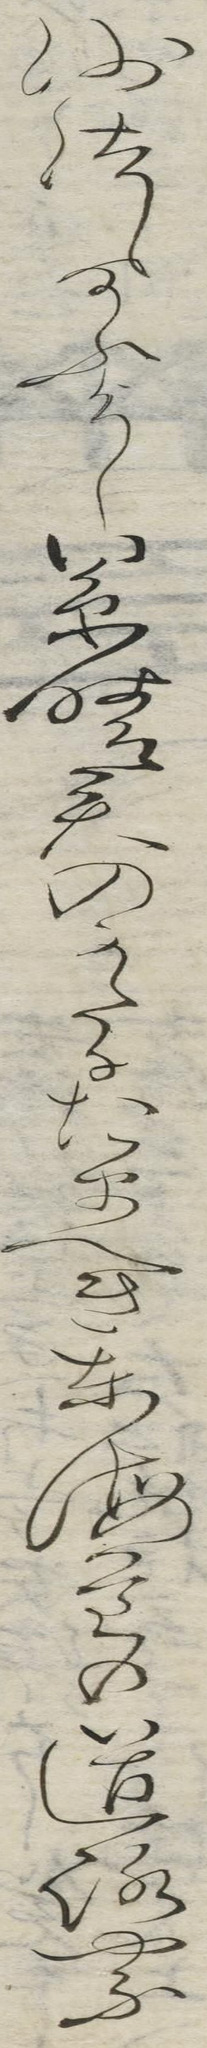沙汰給ふよし？？？天のかたにたまへき東海道の道路やふ
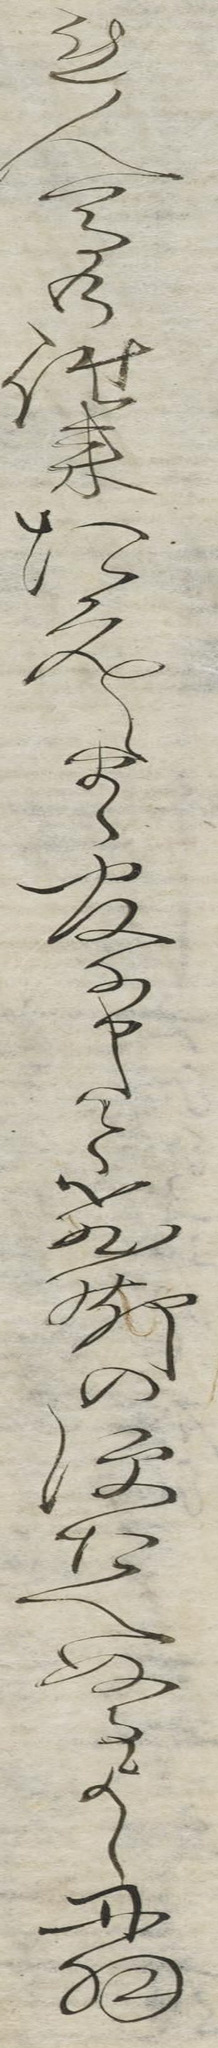れ人馬の往来たえしまゝ友に申けり飛脚の便たへぬるよし丹羽
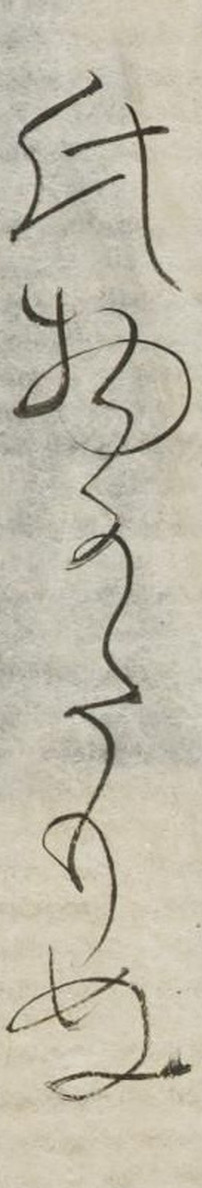氏物かたりぬ
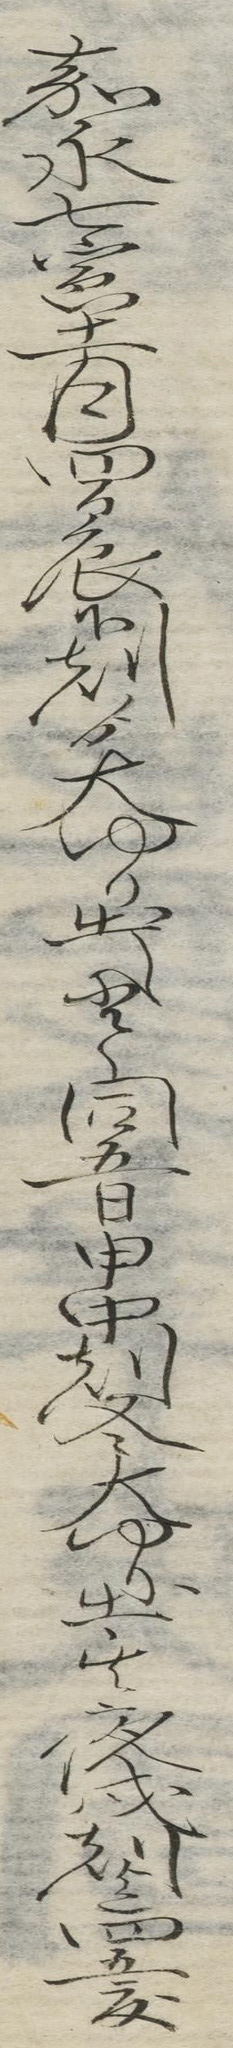嘉永七寅十一月四日辰下刻ゟ大ゆり出しにて同五日申中刻又〻大ゆり出其夜戌刻迄四五度

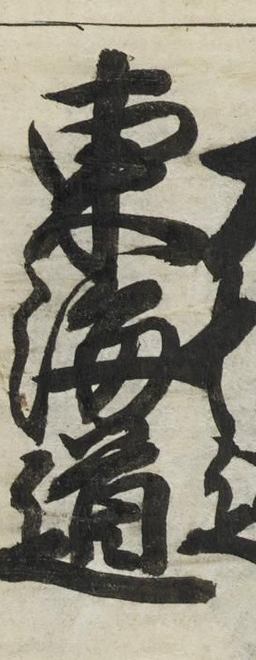東海道
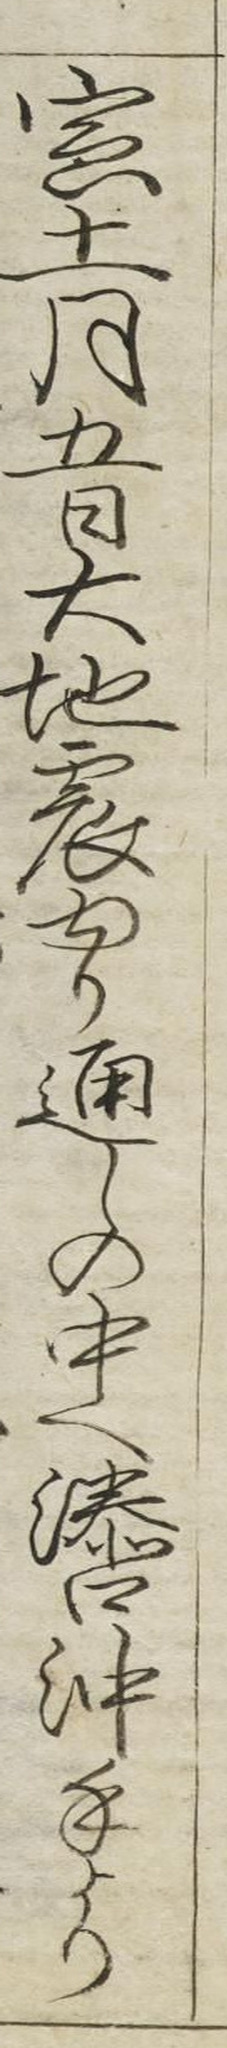寅十一月五日大地震ゆり通しの中へ湊口沖手より
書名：大地震實録
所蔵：東京大学地震研究所図書室 Earthquake Research Institute Library, The University of Tokyo, JAPAN
